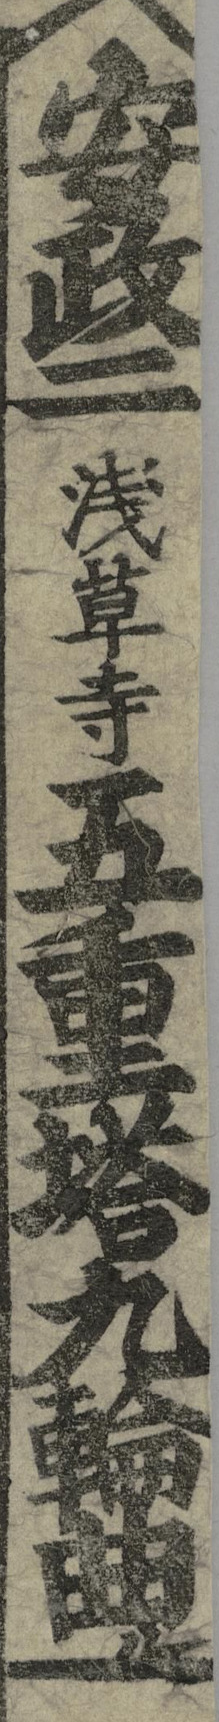安政二浅草寺五重塔九輪曲ル
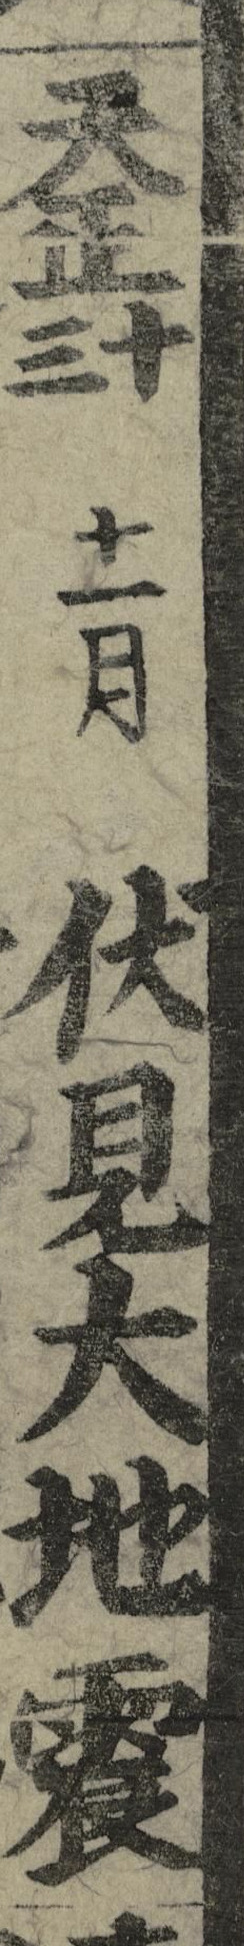天正十三十一月伏見大地震
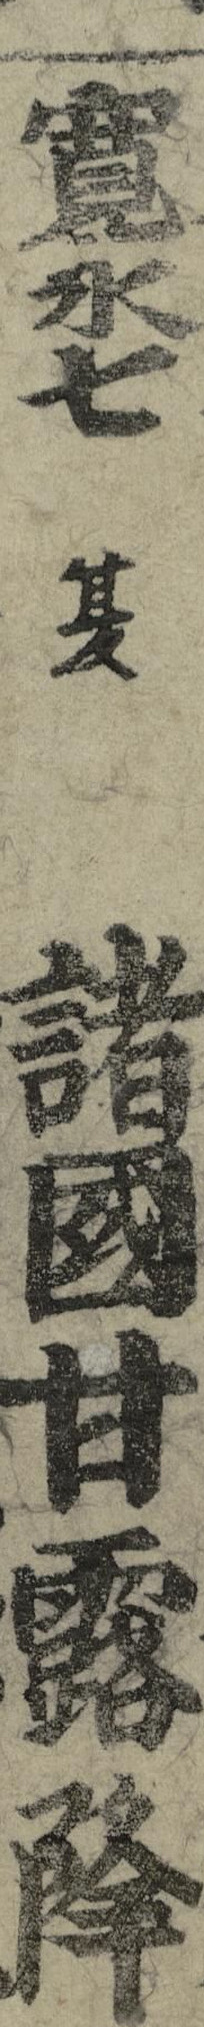寛永七夏諸国甘露降
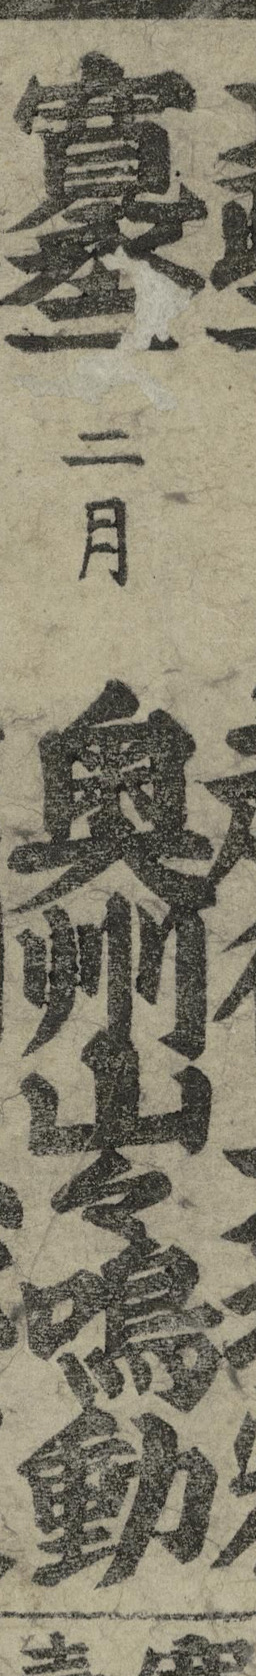寛永二二月奥州山々鳴動
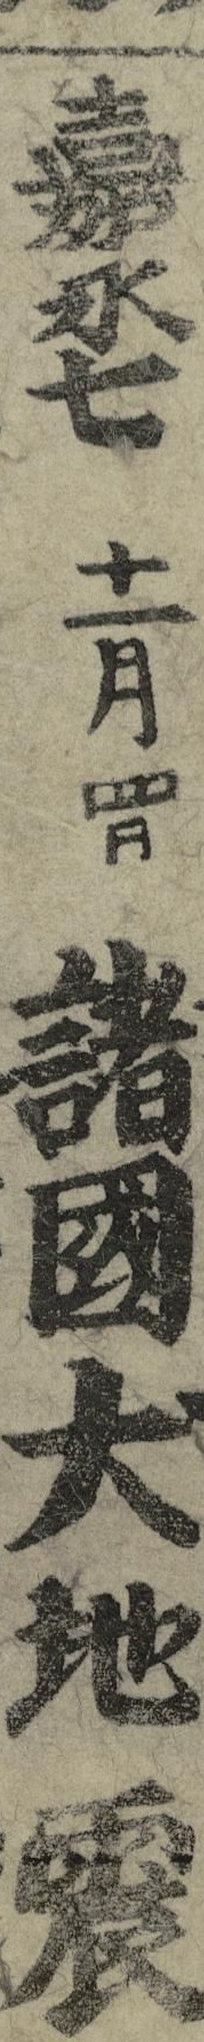嘉永七十一月四日諸国大地震
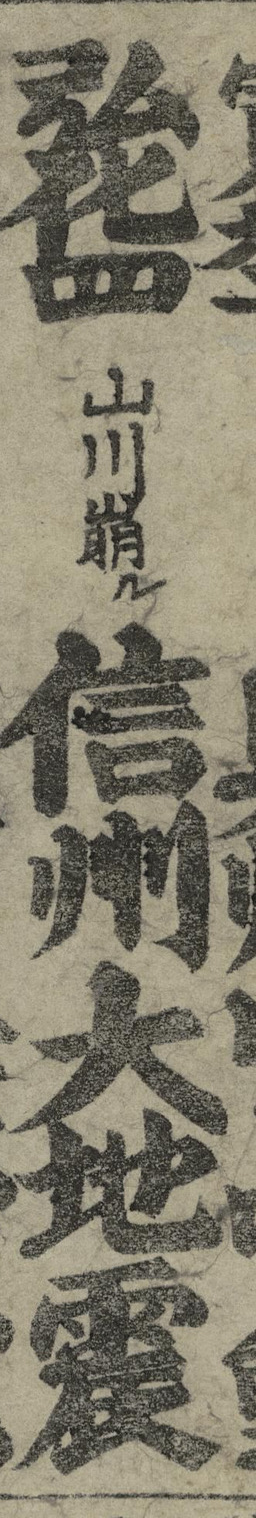弘化四山川崩ル信州大地震
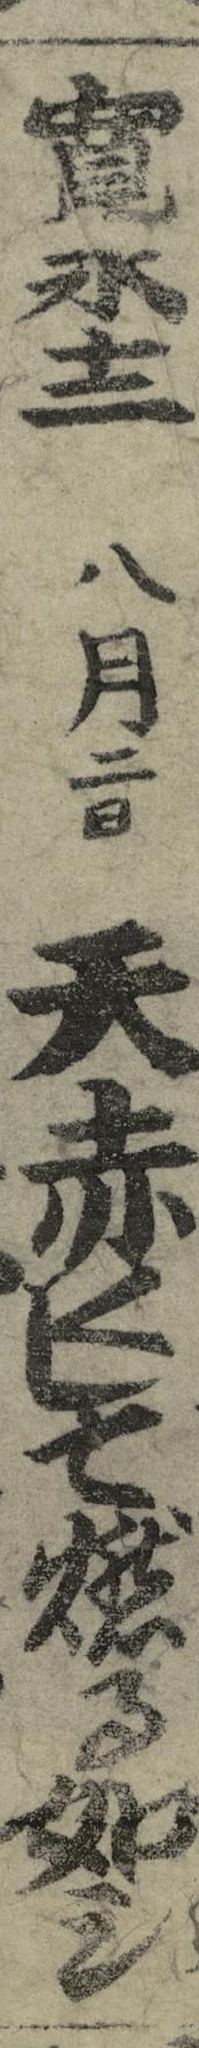寛永十二八月二日天赤くして燃る如シ
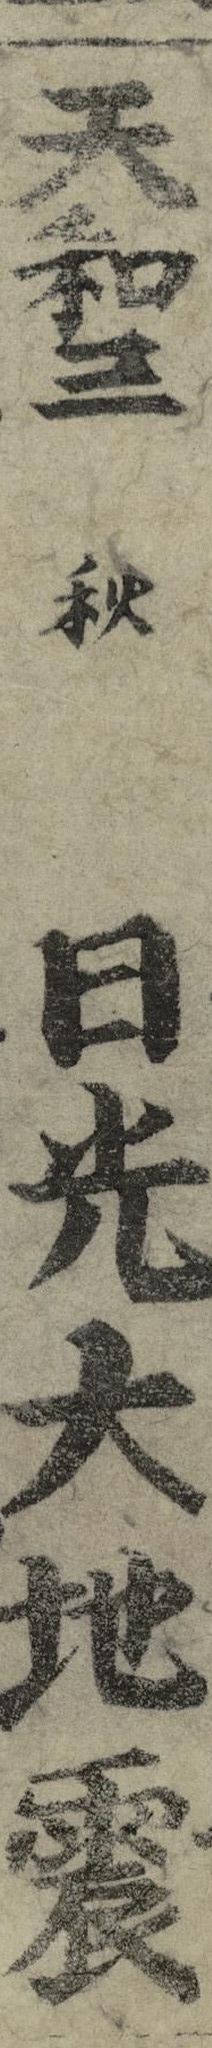天和三秋日光大地震
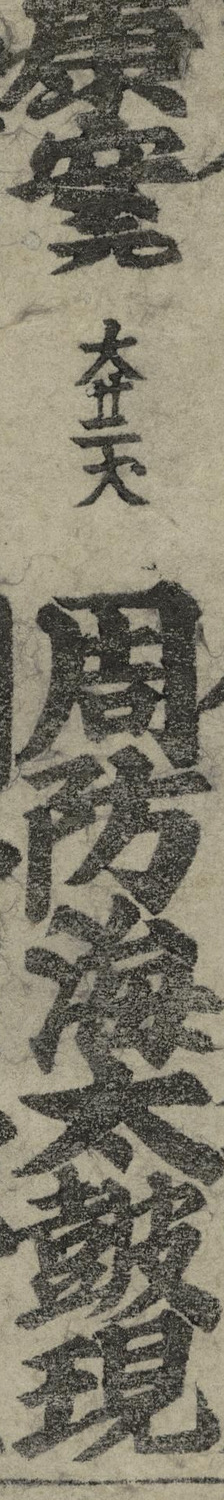康安元大井二犬周防海太皷現
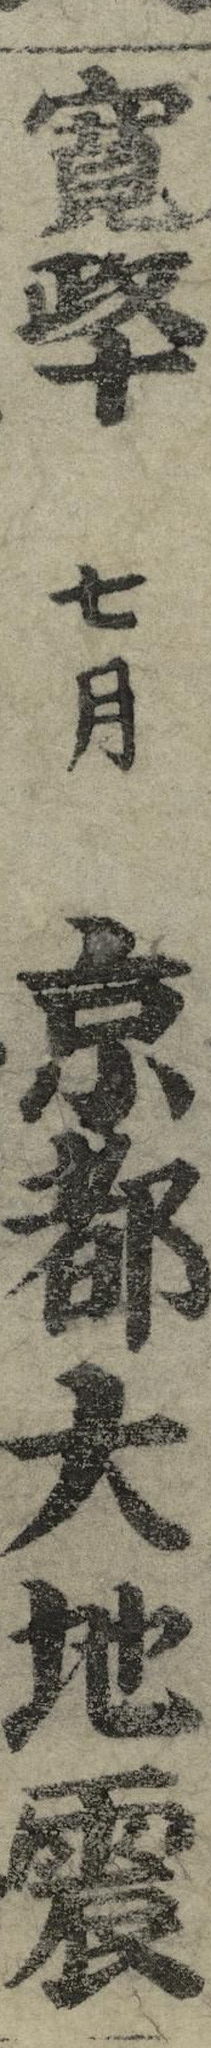寛政十七月京都大地震
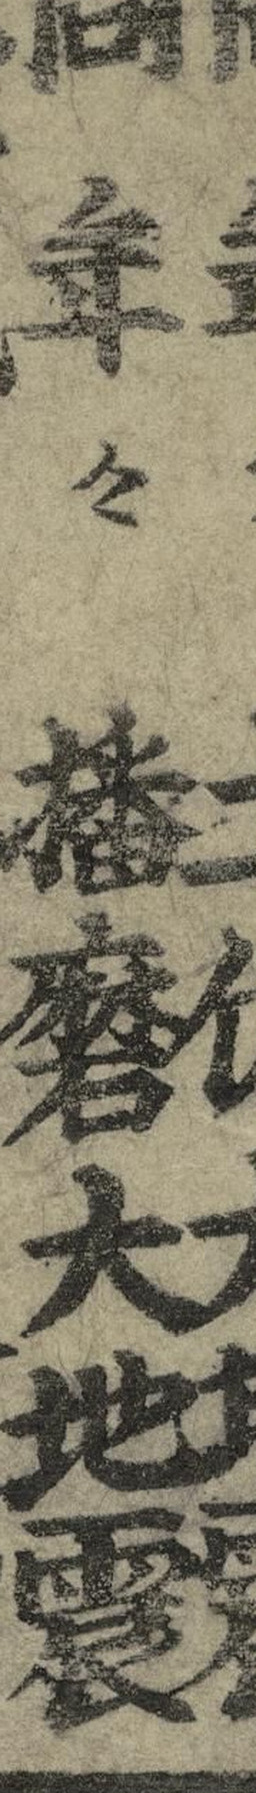同年仝播磨大地震
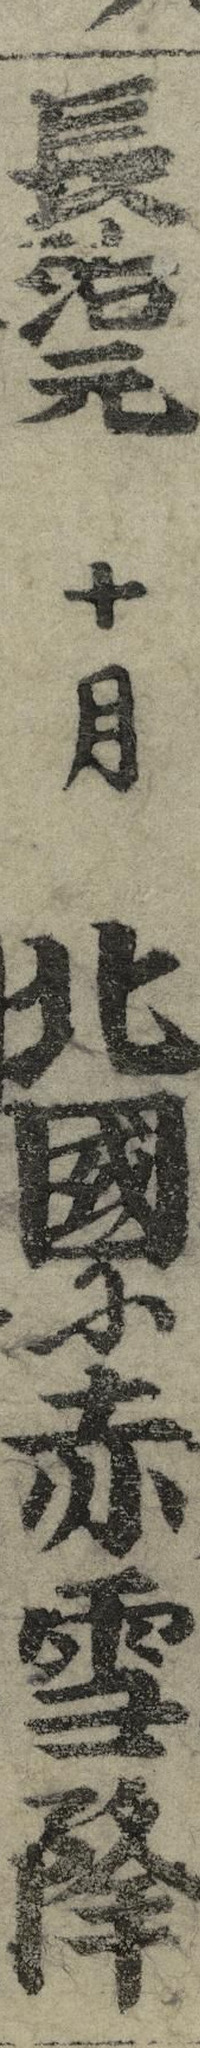長治元十月北国に赤雪降
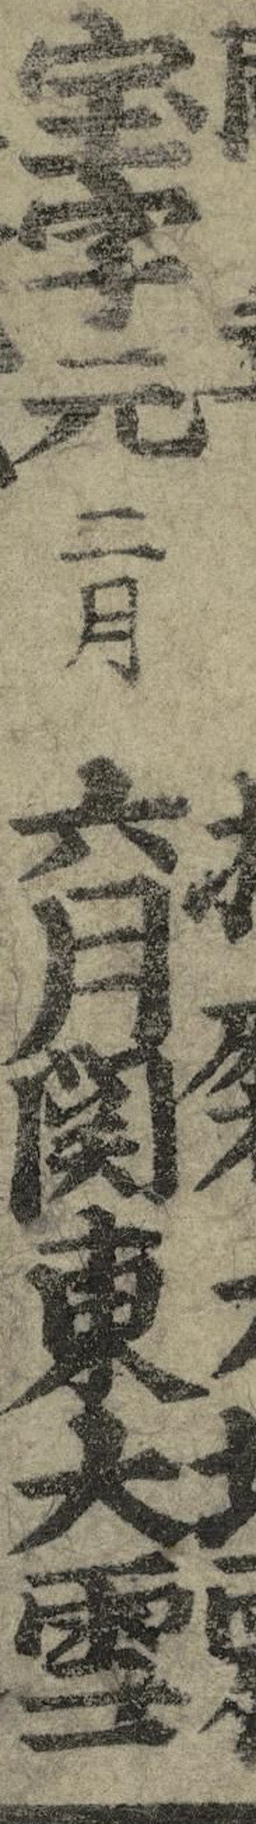宝字元二月六月関東大雪
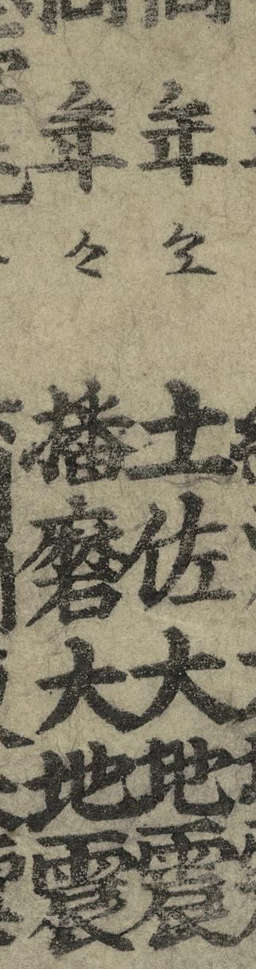同年仝播磨大地震
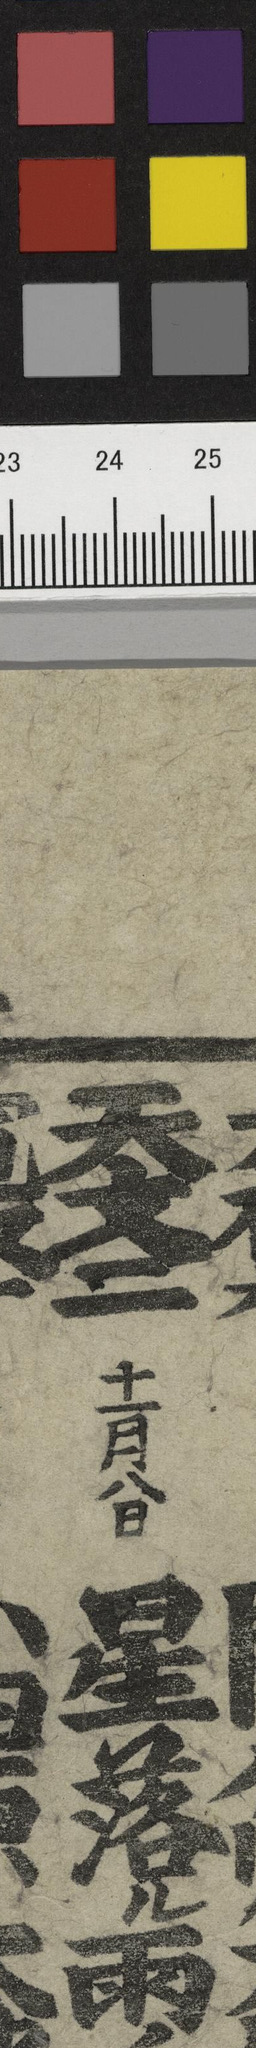天文二十一月八日星落ル雨ノ如ク
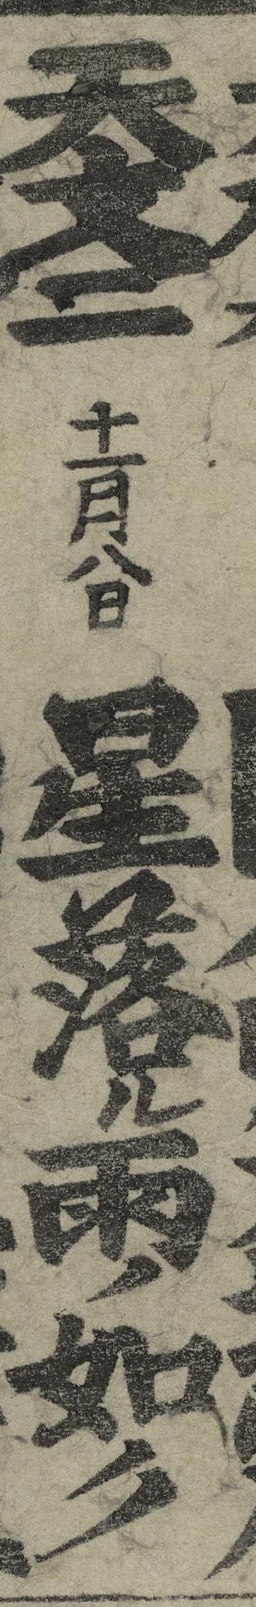天文二十一月八日星落ル雨ノ如ク
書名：珎事一覧
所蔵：東京大学地震研究所図書室 Earthquake Research Institute Library, The University of Tokyo, JAPAN
